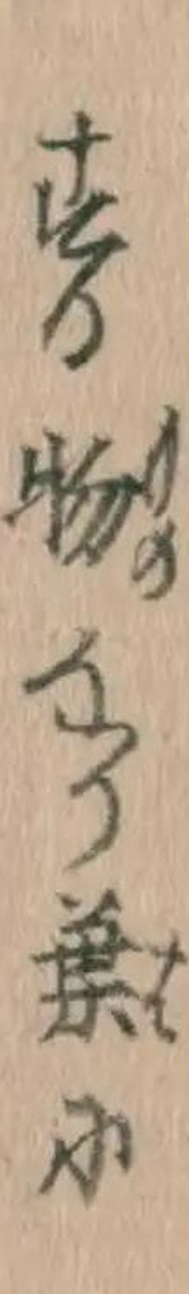する物なり葉に
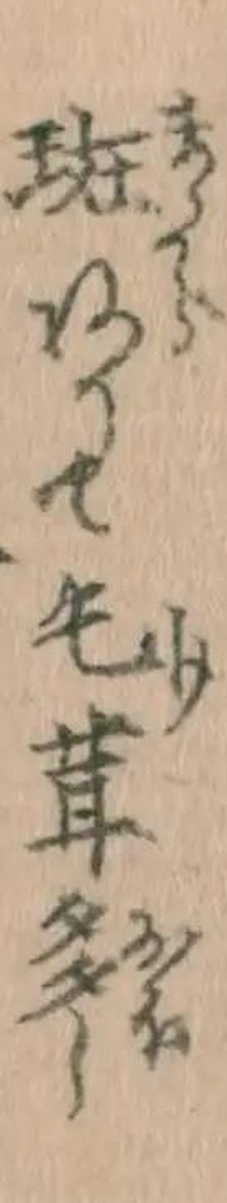斑ありて毛茸多し
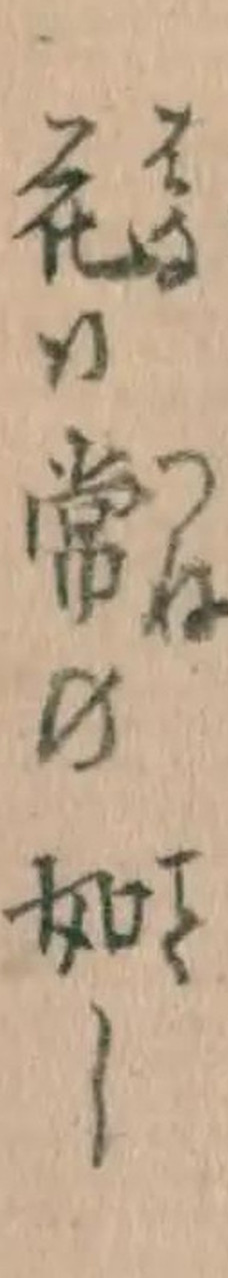花は常の如し
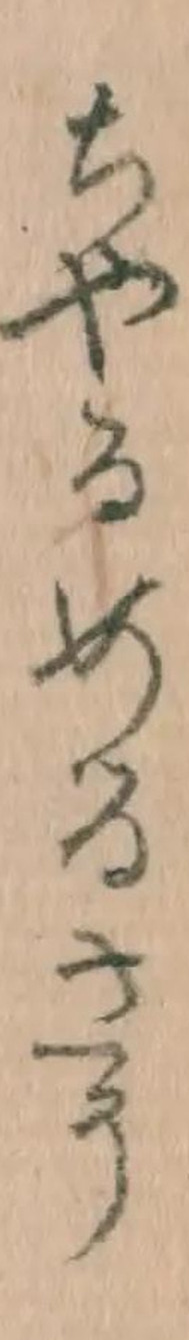ちやるめるさう
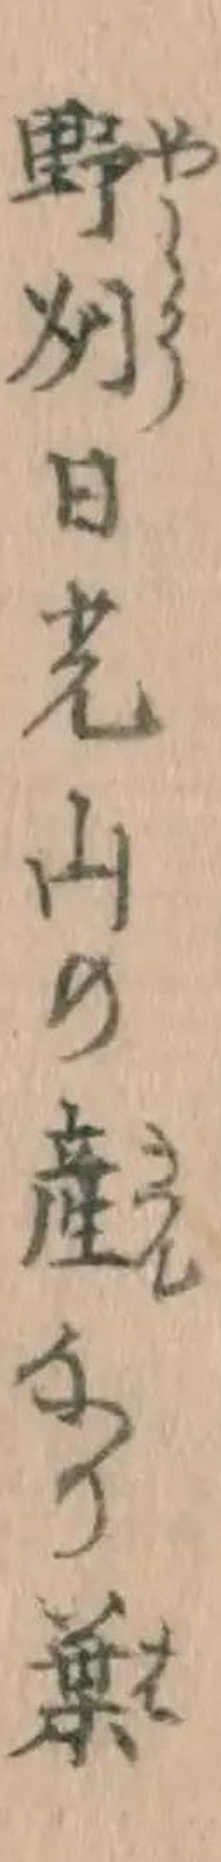野州日光山の産なり葉
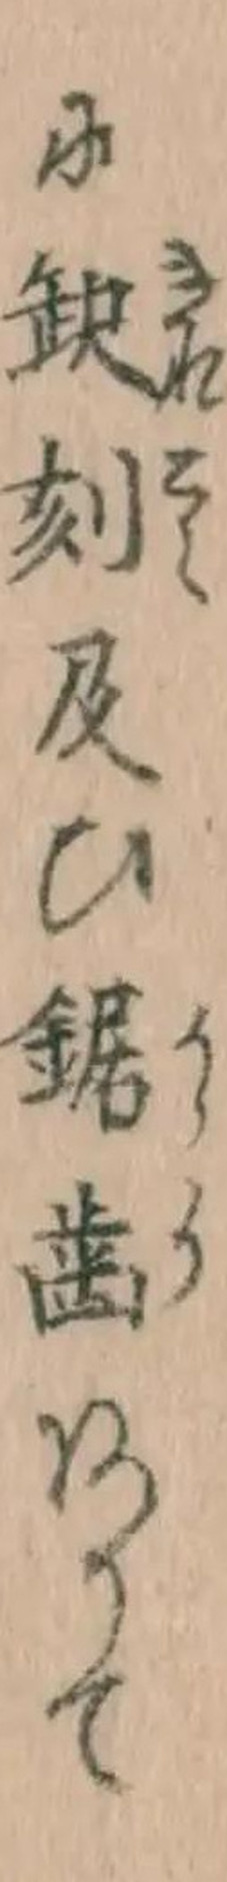に欠刻及ひ鋸歯ありて
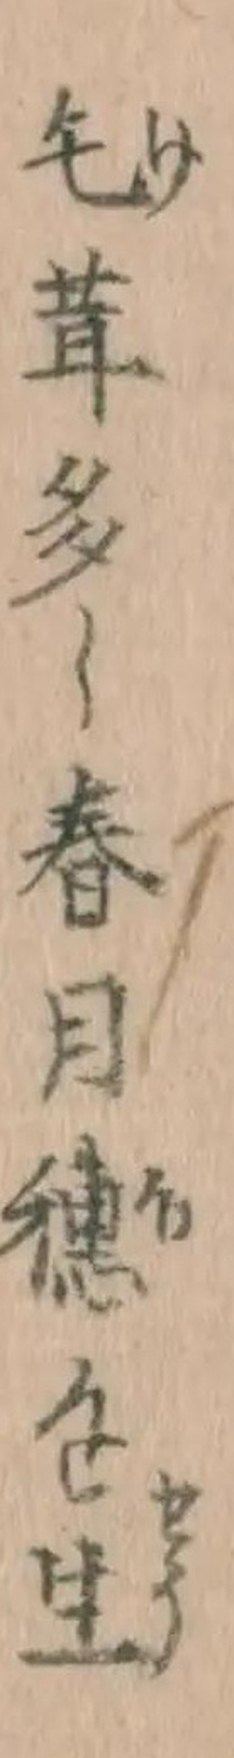毛茸多し春月穂を生
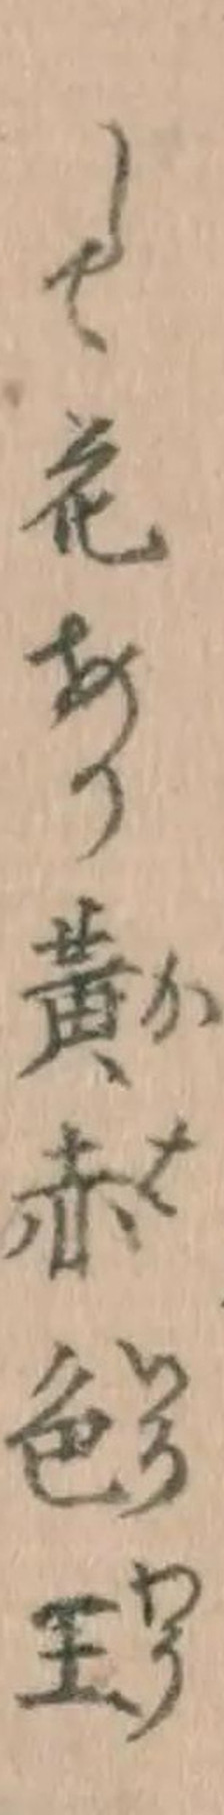して花あり黄赤色王

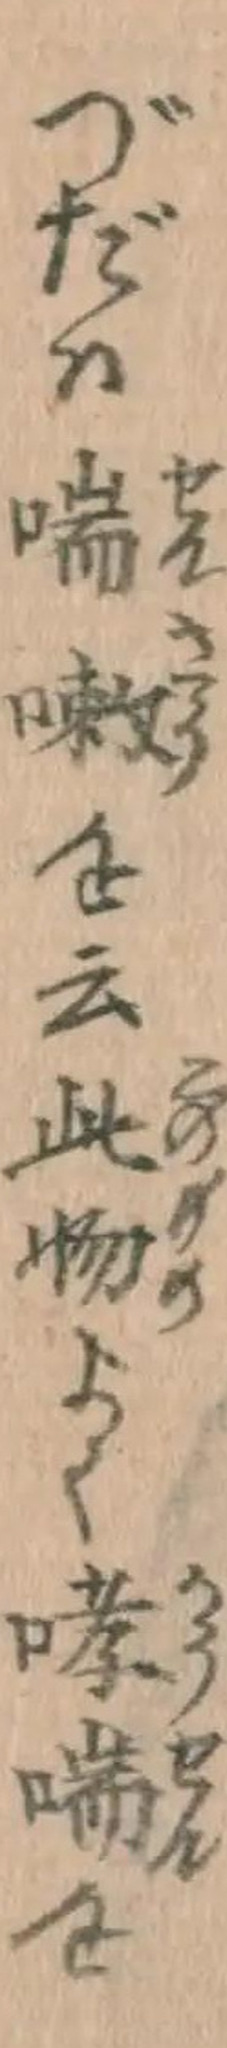づだは喘嗽を云此物よく哮喘を
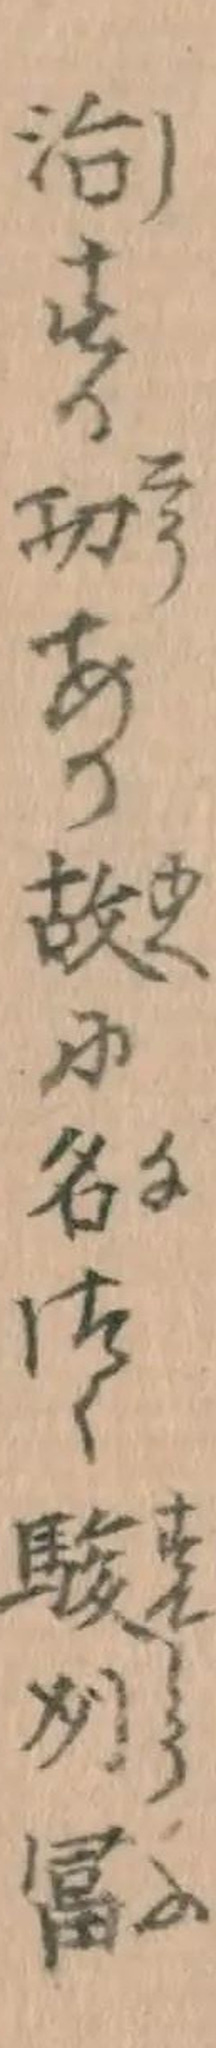治する功あり故に名つく駿州富
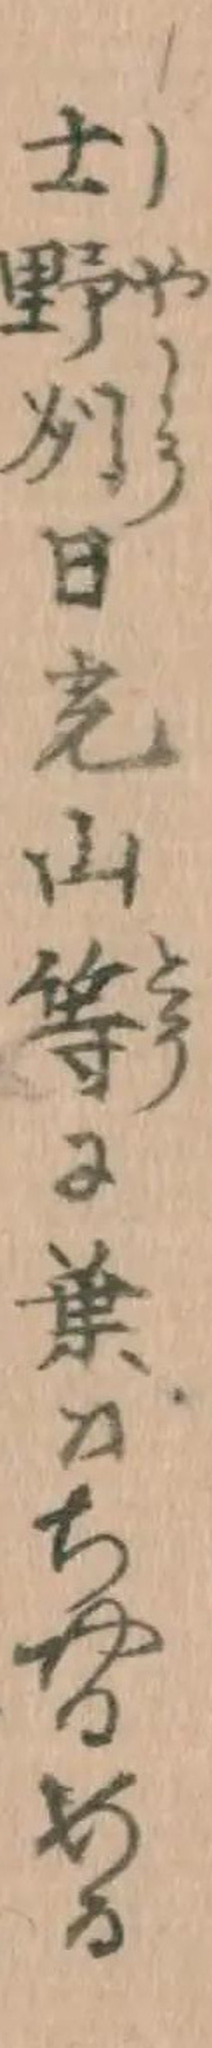士野州日光山等に葉はちやるめる
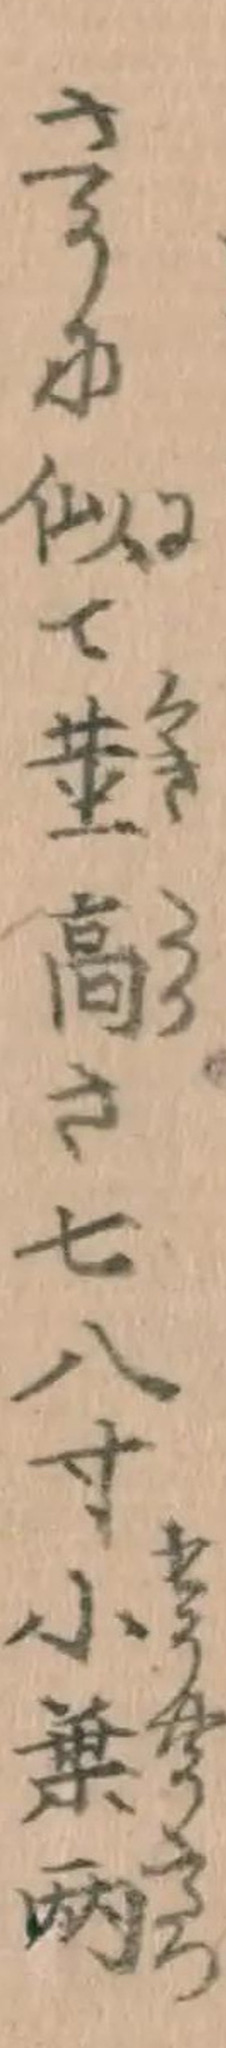さうに似て茎高さ七八寸小葉両
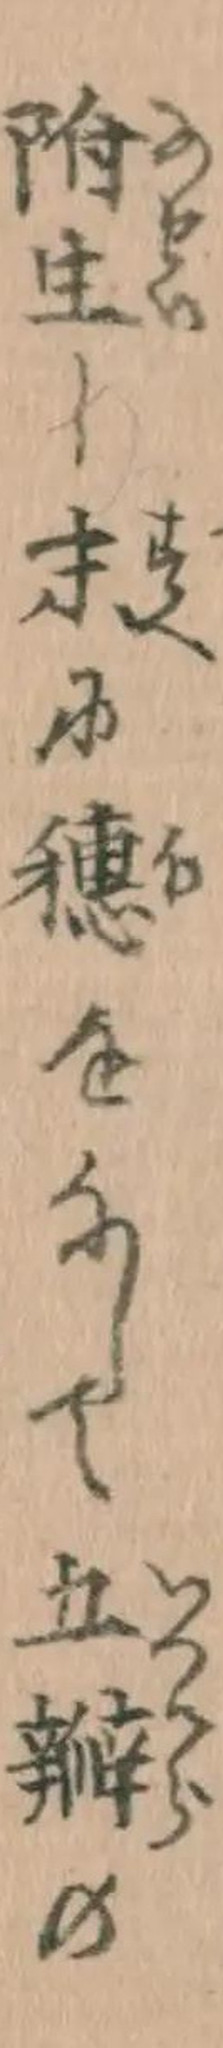附生し末に穂をなして五弁の
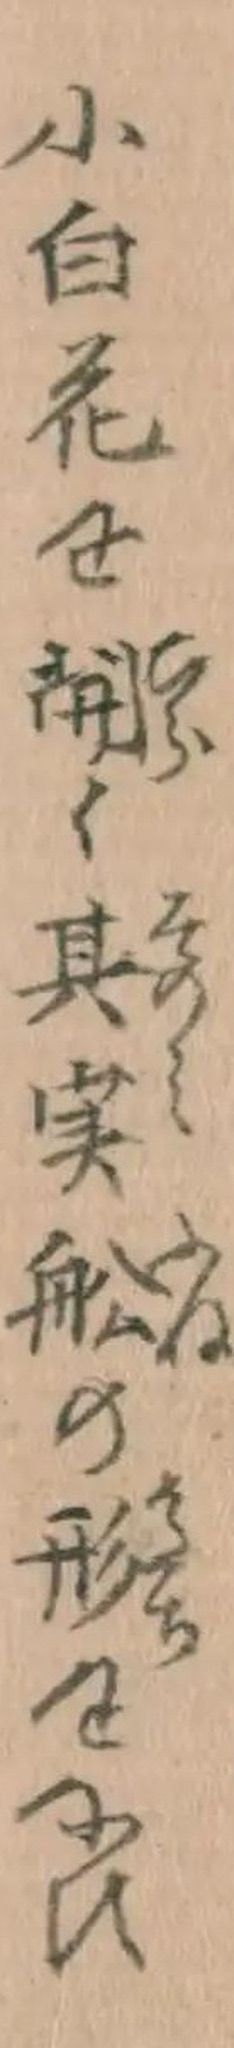小白花を開く其実船の形をなす
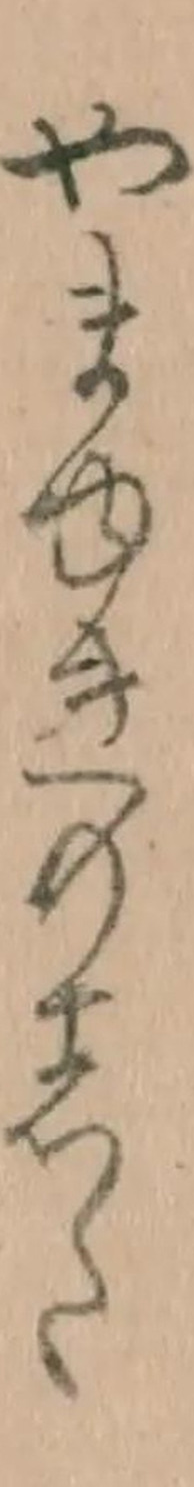やまゆきのした
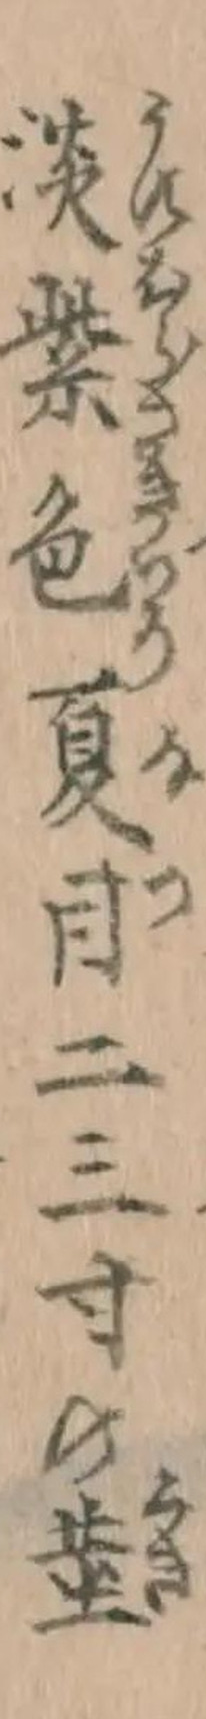淡紫色夏月二三寸の茎
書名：本草図譜. 巻34-36
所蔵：国立国会図書館 National Diet Library, JAPAN
